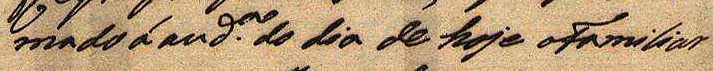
mado á aud.a do dia de hoje o Familiar
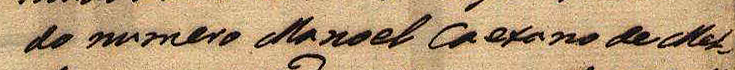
do numero Manoel Caetano de Mel
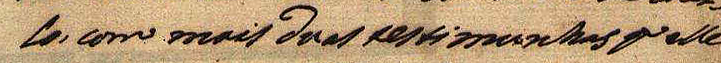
lo, com mais duas testimunhas q̄ elle
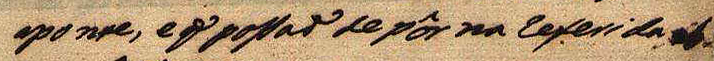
aponte, e q̄ possaõ depôr na Referida ab
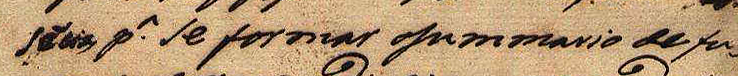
ēcia p.a se formar o summario de fu
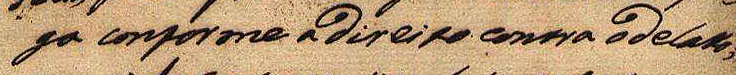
ga conforme a direito contra o delato,
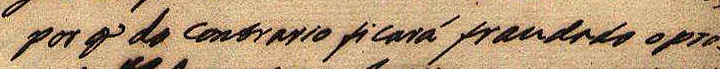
porq̄ do contrario ficará fraudado o pro
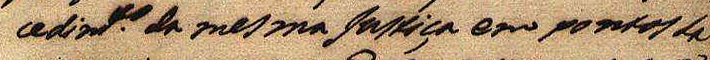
cedim.to da mesma Justiça em pontos da
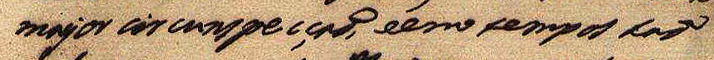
mayor circunspecçaõ, e em tempos taõ
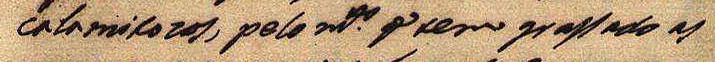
calamitozos, pelo m.to q̄ tem grassado as
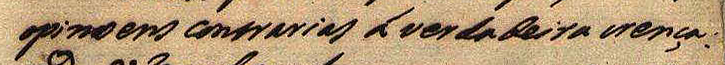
opinoens contrarias á verdadeira crença.
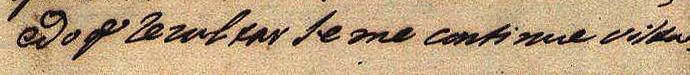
e do q̄ Rezultar se me continue vista
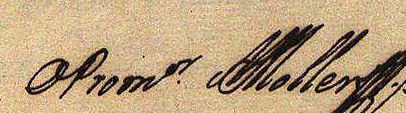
O Prom.or Moller
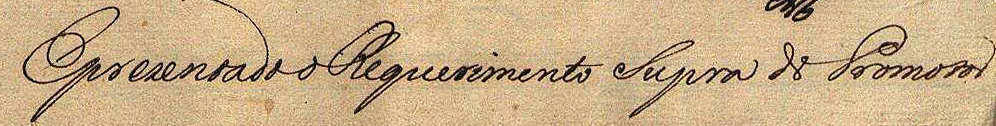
E prezentado o Requerimento Supra do Promotor
